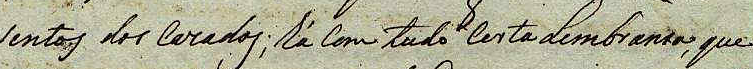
sentos dos cazados, há com tudo certa Lembransa, que
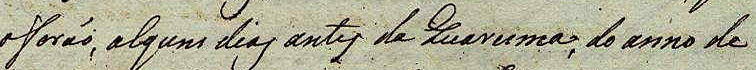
o foraõ, alguns dias antes da Quaresma, do anno de
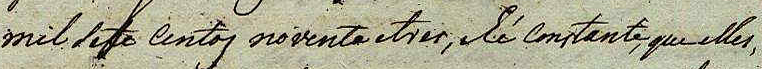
mil sete centos noventa e tres, hé constante que elles,
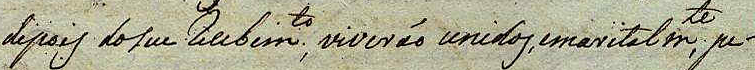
depois do seu Recebim.to, viveraõ unidos, e maritalmte, pe
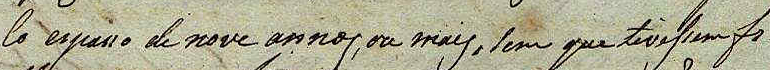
lo espasso de nove annos, ou mais, sem que tivessem fi
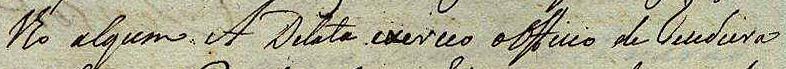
lho algum. A Delata exerceo o officio de Tecedeira
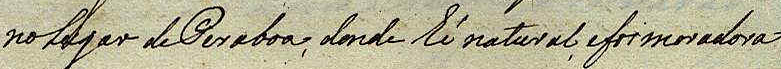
no Lugar de Peraboa, donde hé natural, e foi moradora
